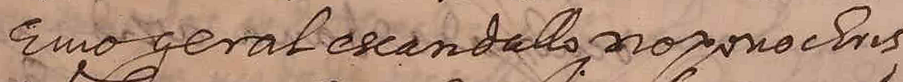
E uio geral escandallo no pouo chris
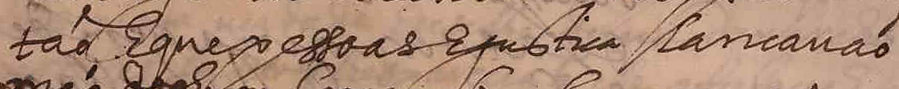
taõ E que pessoas E justiça lancauaõ
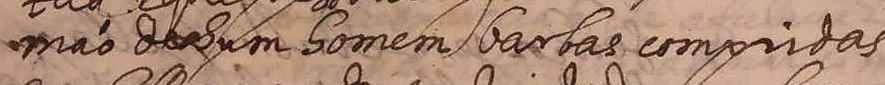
maõ de hum homem barbas compridas
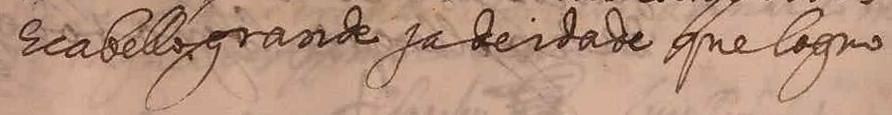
E cabello grande ja de idade que loguo
